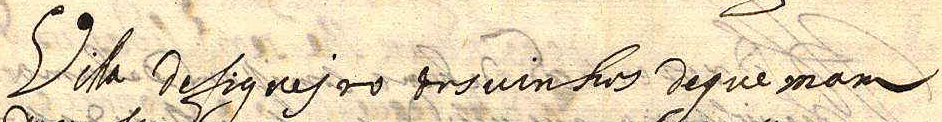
Villa de figuejro dos uinhos de que mam
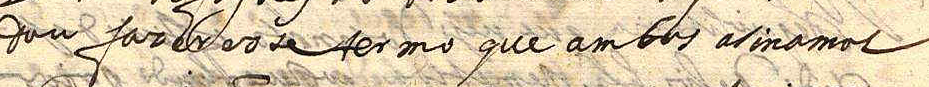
dou fazer este termo que ambos asinamos
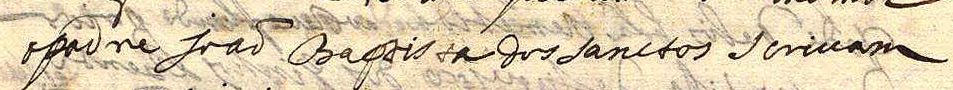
o padre joaõ Baptista dos Sanctos scriuam
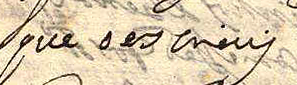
que o escreuj
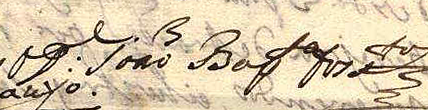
o p.e Ioaõ Bapta dos Stos
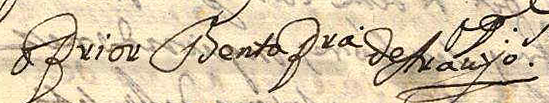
o prior Bento pra de Araujo.
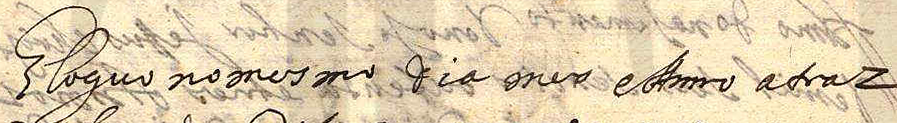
E loguo no mesmo dia mes e Anno atraz
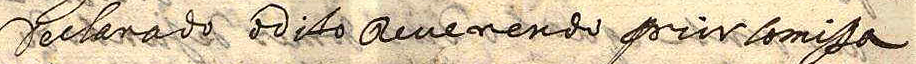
declarado o dito Reuerendo prior comissa
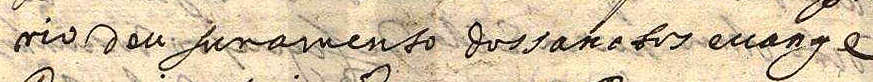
rio deu juramento dos sanctos euange
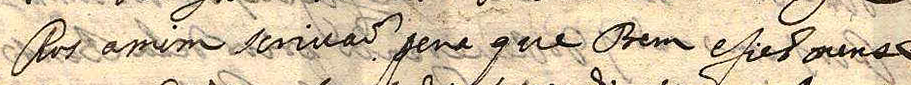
lhos a mim scriuaõ pera que Bem e fielmente
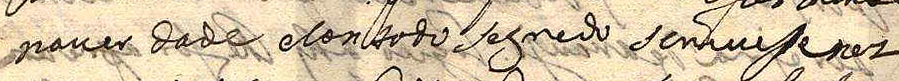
na uerdade e con todo segredo screuesse nes
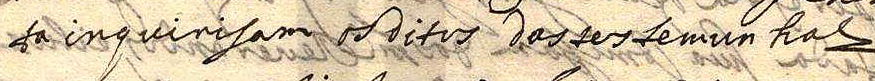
ta inquirisam os ditos das testemunhas
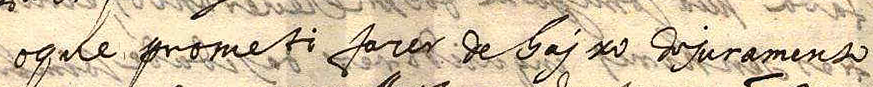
o que prometi fazer debajxo do juramento
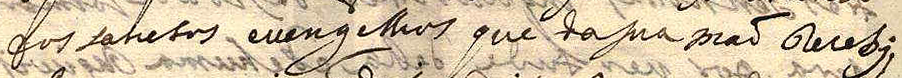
dos sanctos euangelhos que da sua maõ Recebj,
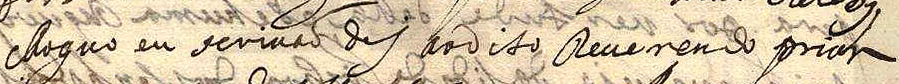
e lloguo eu scriuaõ dej ao dito Reuerendo prior
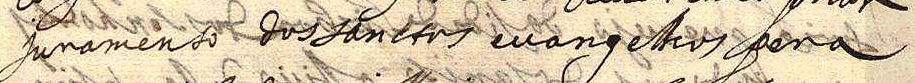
juramento dos sanctos euangelhos pera
